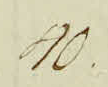40
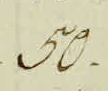50
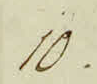10
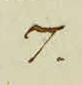7
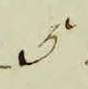5
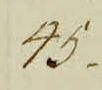45
